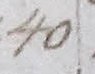40
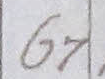67
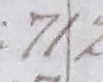71
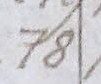78
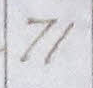71
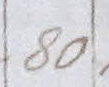80
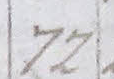72
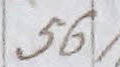56
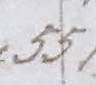55
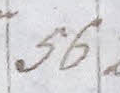56
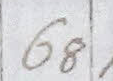68
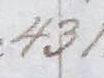43
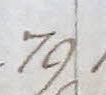79
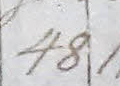48
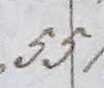55
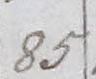85
